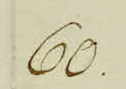60
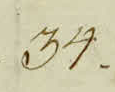34
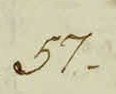57
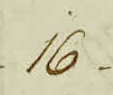16
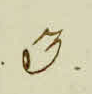3
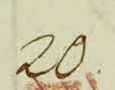20
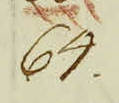64
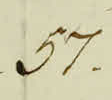57
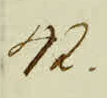42
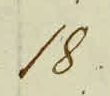18
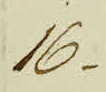16
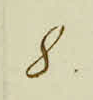8
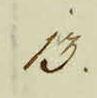13
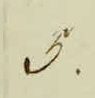5
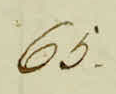65
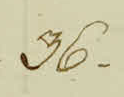36
